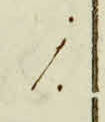1.
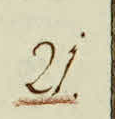21.
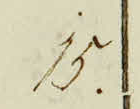15.
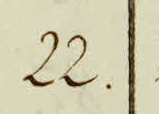22.
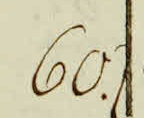60.
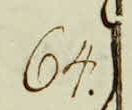64.
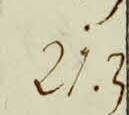21.
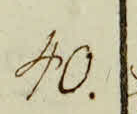40.
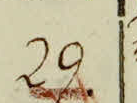29.
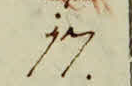17.
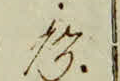13.
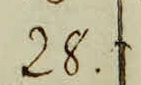28.
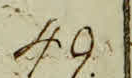49.
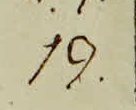19.
